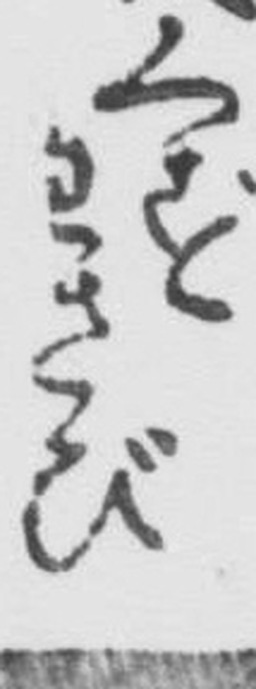わさび
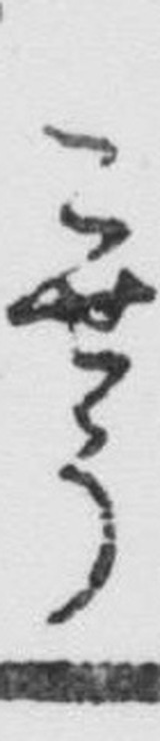こせう

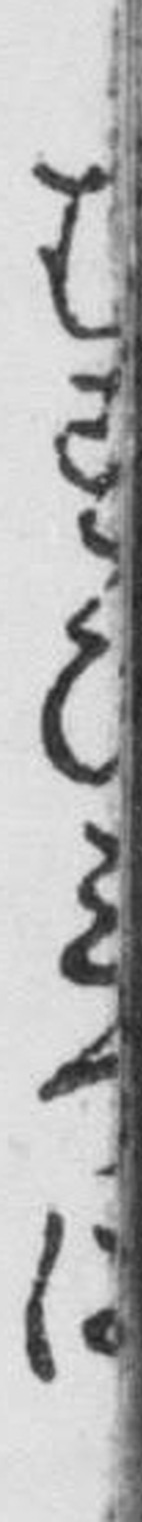むすびみつば
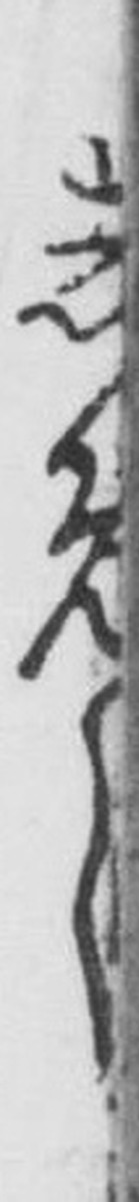しめし
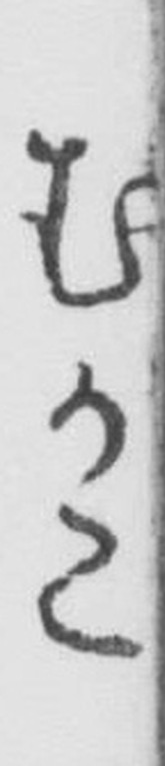むかこ
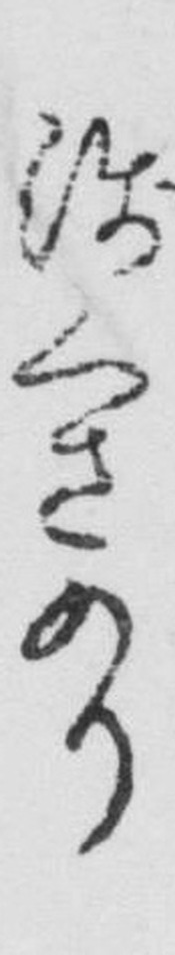浅くさのり
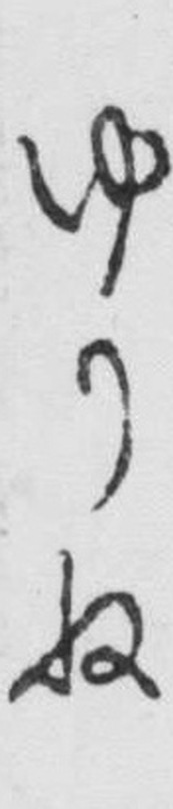ゆりね
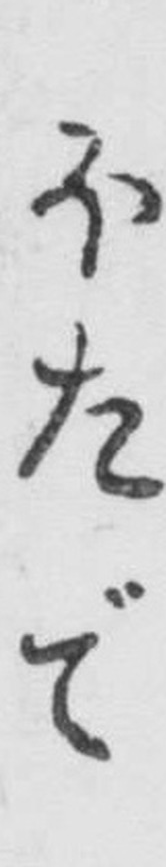ほたで
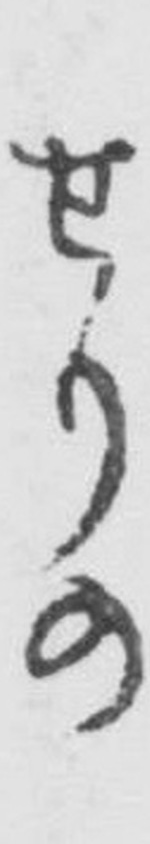せりの
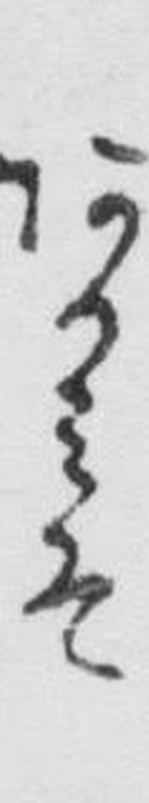あかみそ
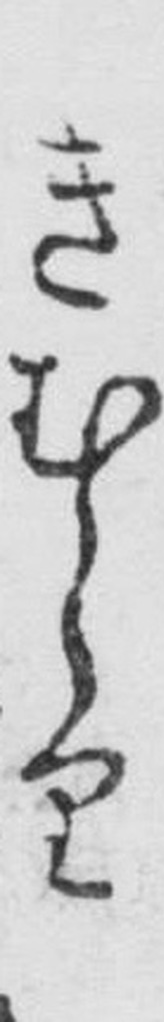きむしり
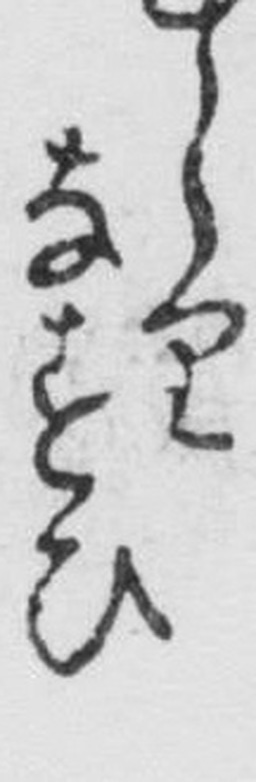なすひ
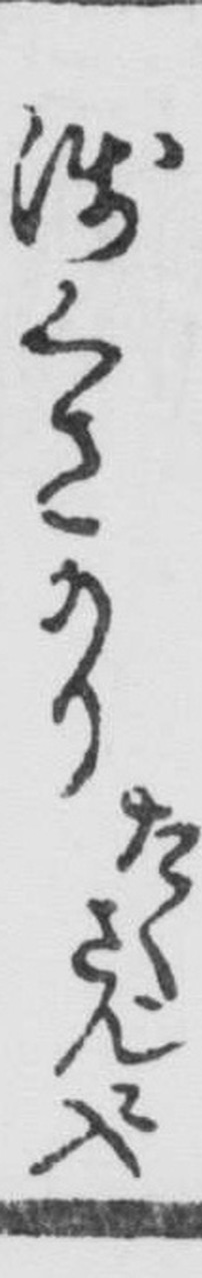浅くさのりたくさんに入
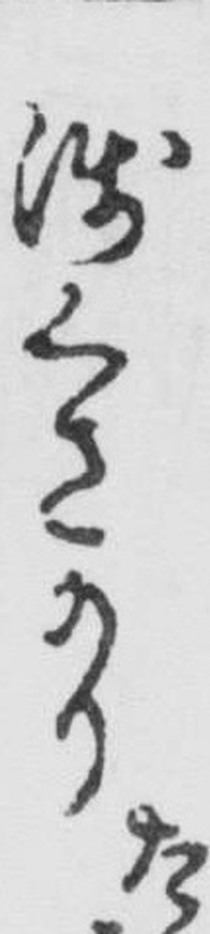浅くさのり
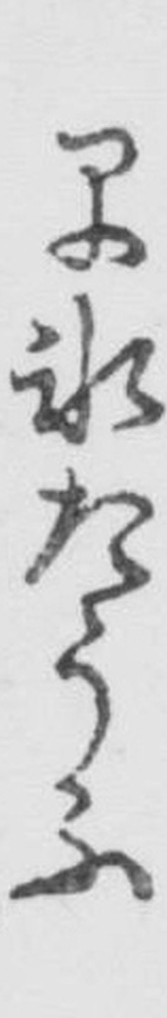早氷たうふ
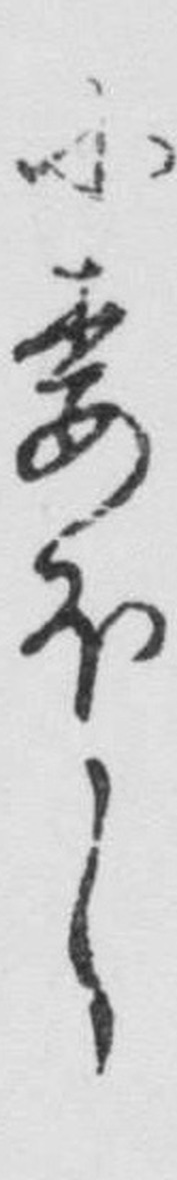小梅ほし
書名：諸家通用/即席料理
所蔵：大阪府立大学学術情報センター 国文学研究資料館
